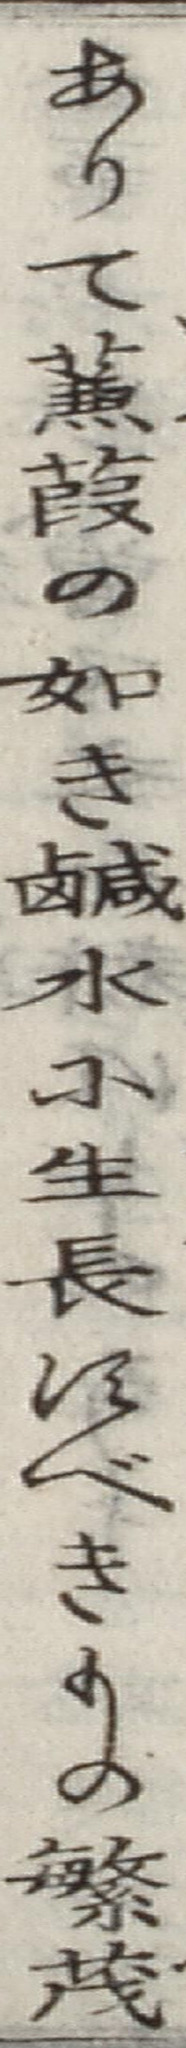ありて、蒹葭の如き鹸水に生長すべきもの繁茂
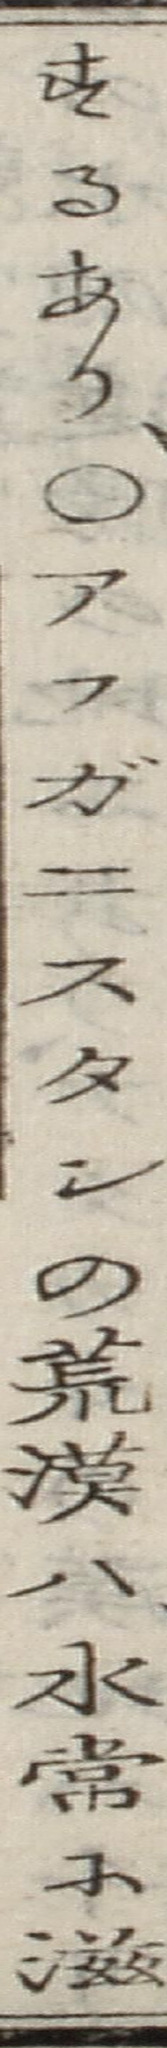するあり、○アフガニスタンの荒漠は、水常に滋
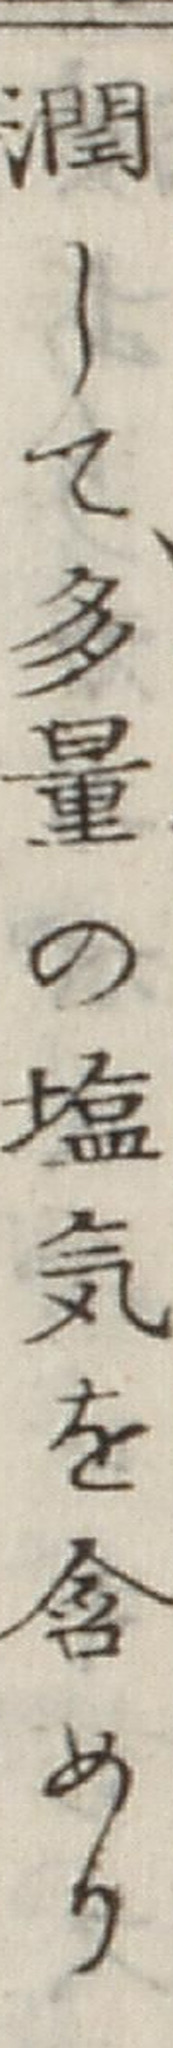潤して、多量の塩気を含めり
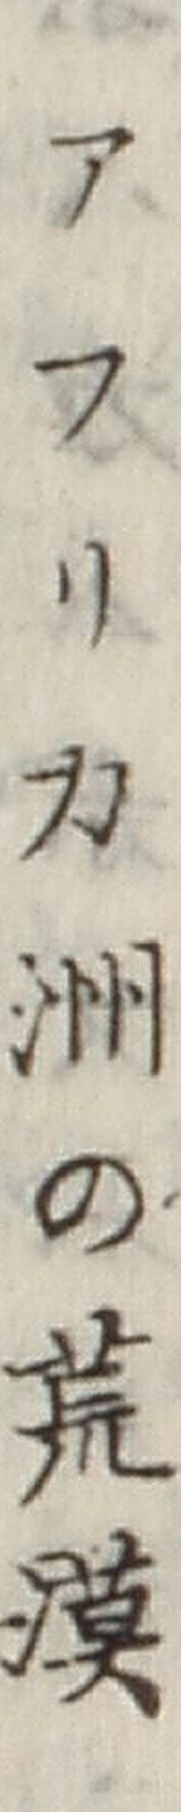アフリカ洲の荒漠
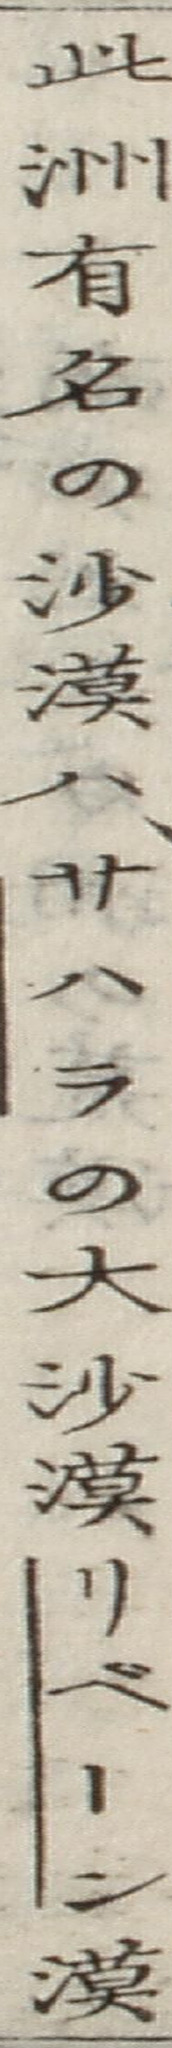此洲有名の沙漠は、サハラの大沙漠、リぺーン漠
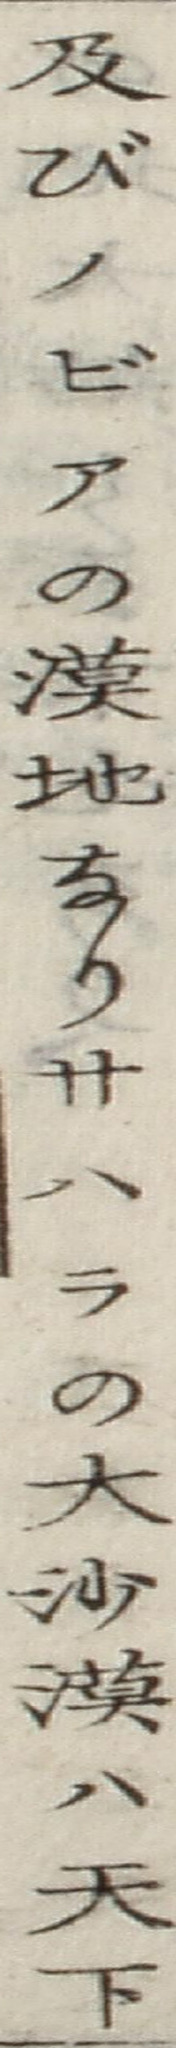及びノビアの漠地なりサハラの大沙漠は天下
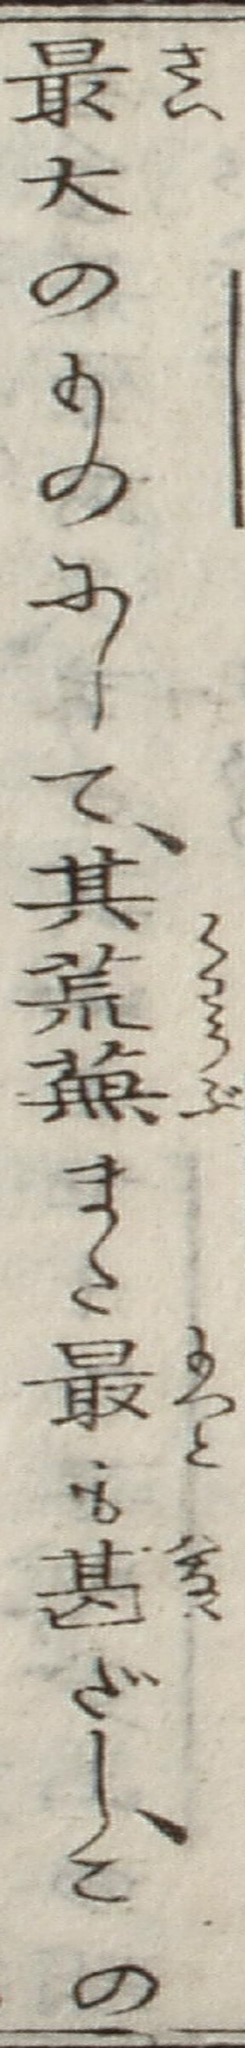最大のものにして、其荒蕪また最も甚だし、この
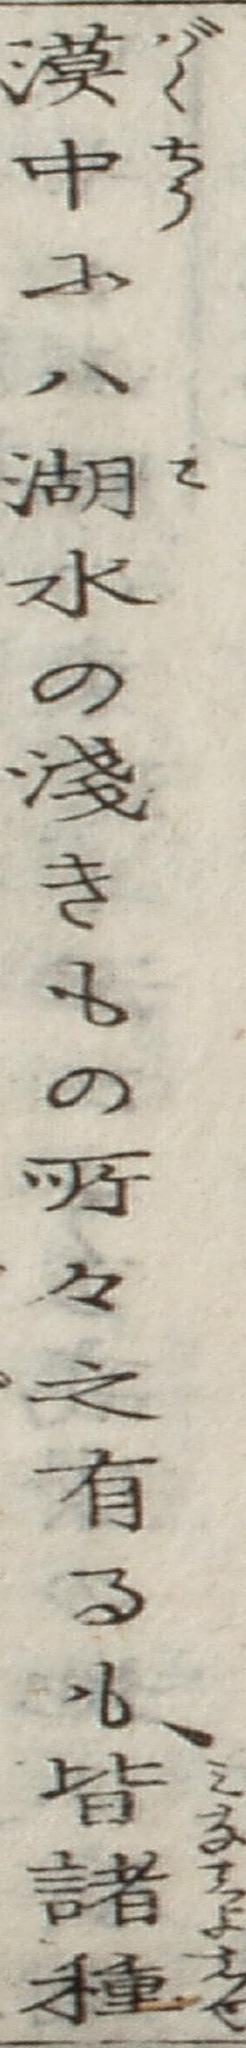漠中には湖水の浅きもの所々之有るも、皆諸種
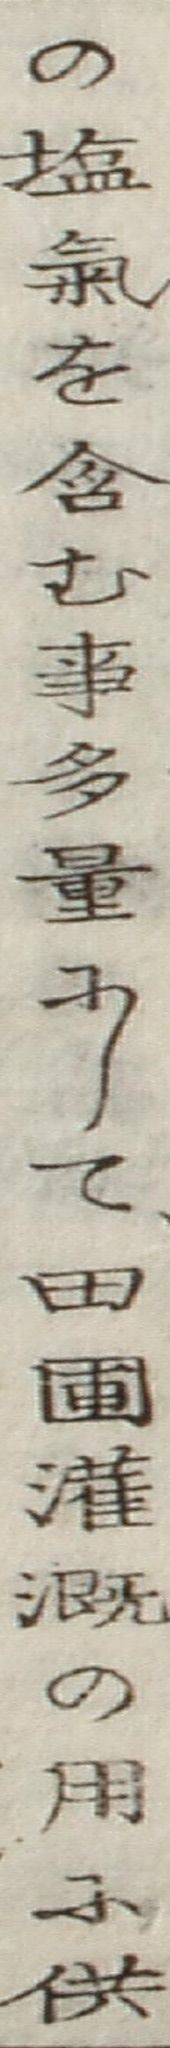の塩気を含む事多量にして、田圃灌漑の用に供
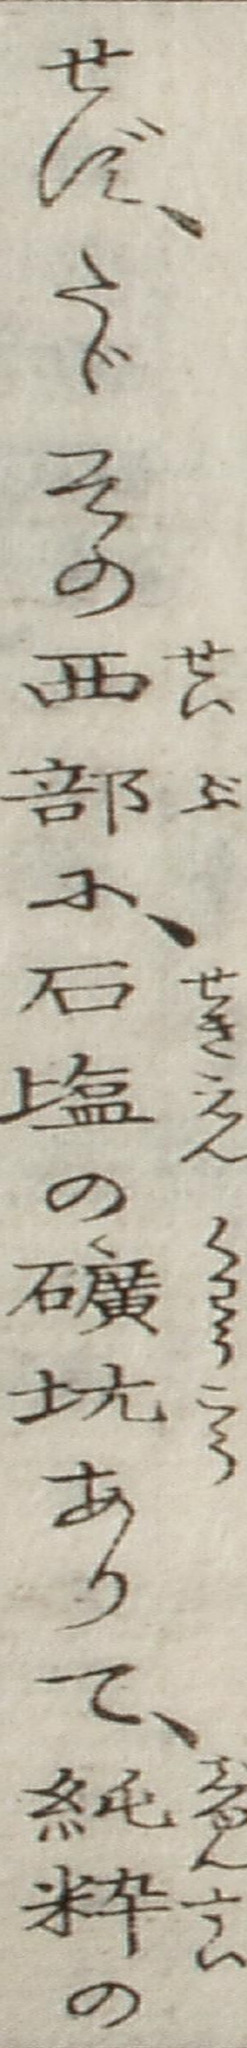せず、たゞその西部に、石塩の礦坑ありて、純粋の

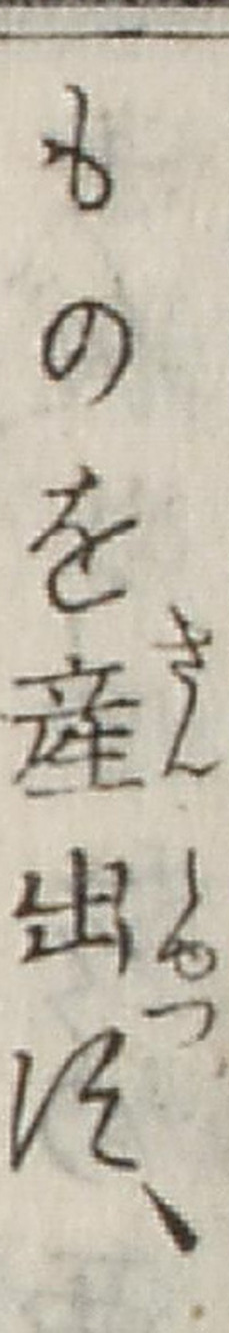ものを産出す、
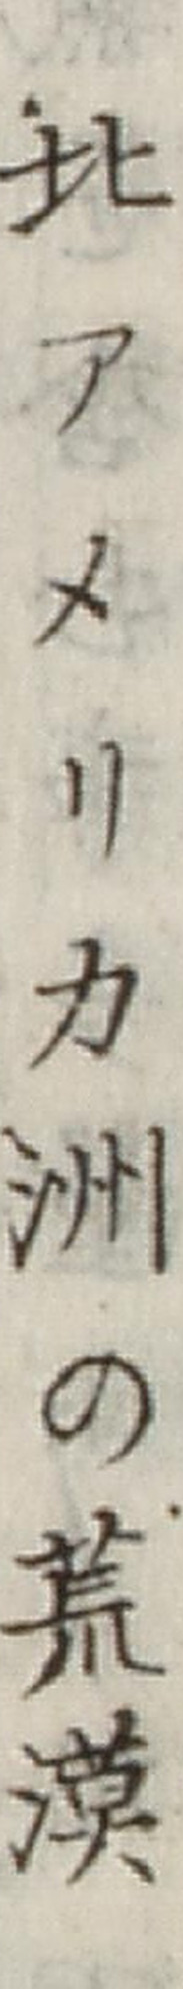北アメリカ洲の荒漠
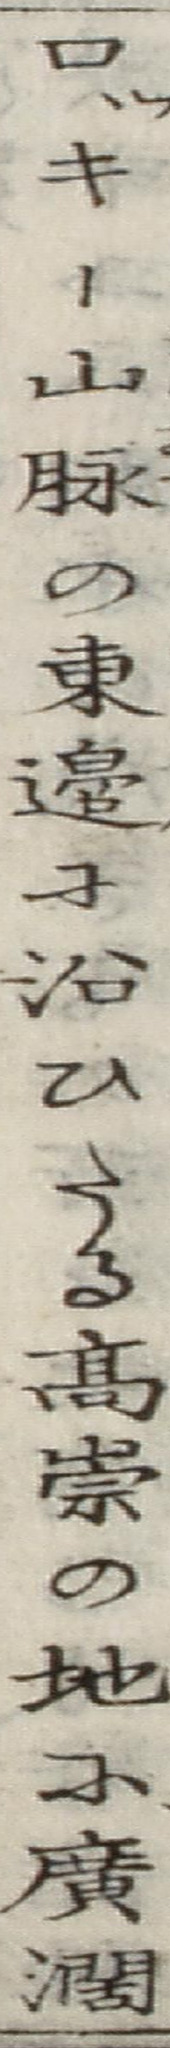ロッキー山脉の東邉に沿ひたる高崇の地に、廣濶
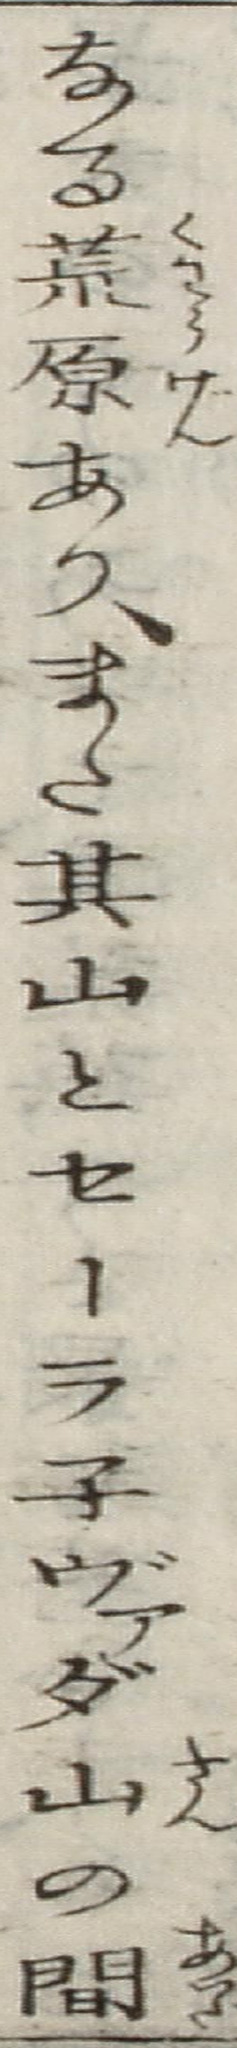なる荒原あり、また其山とセーラ子ヴァダ山の間
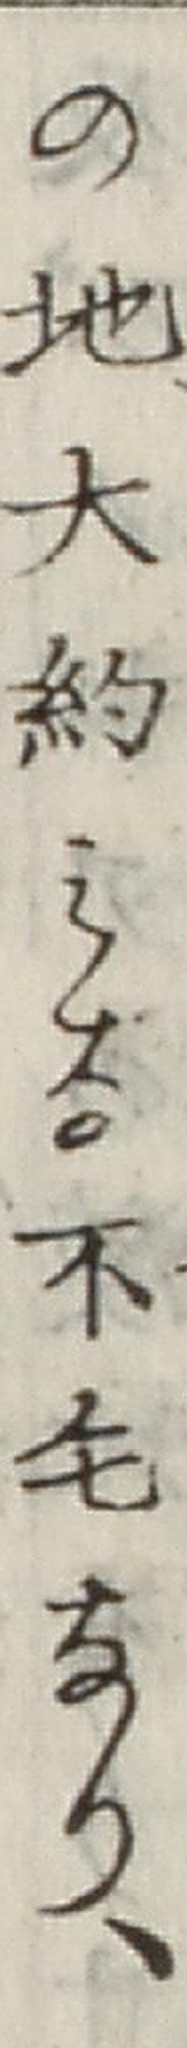の地、大約みな不毛なり、
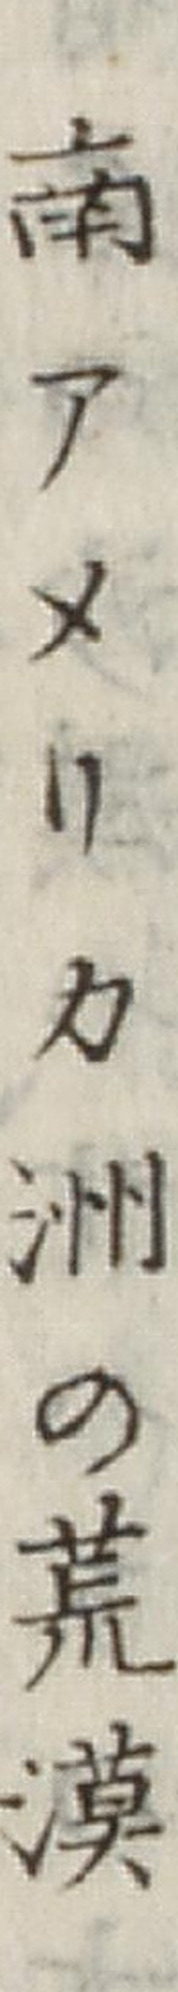南アメリカ洲の荒漠
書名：訓蒙　天然地理學　上
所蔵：東京大学地震研究所図書室 Earthquake Research Institute Library, The University of Tokyo, JAPAN
